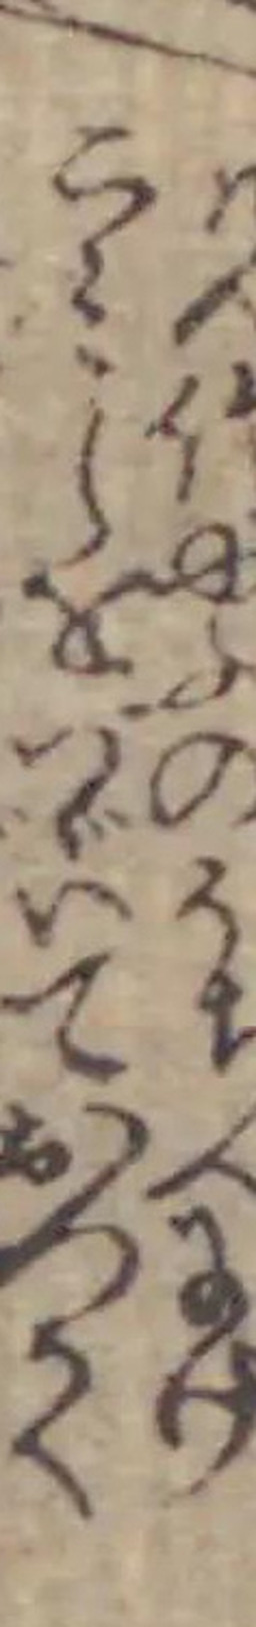こみしをつゞいておつかく
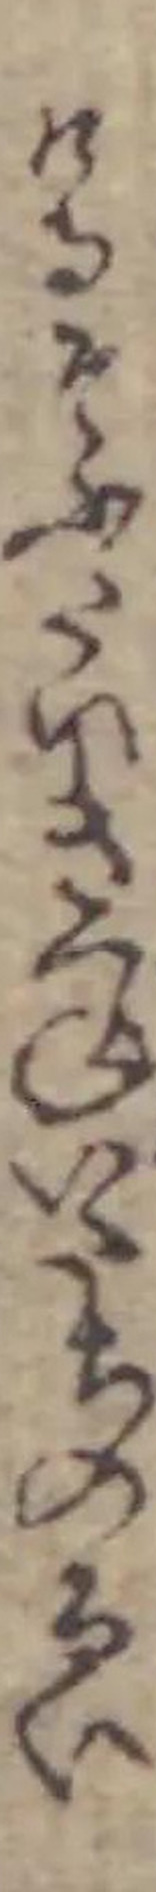けるそふたいきつねいたちのるい
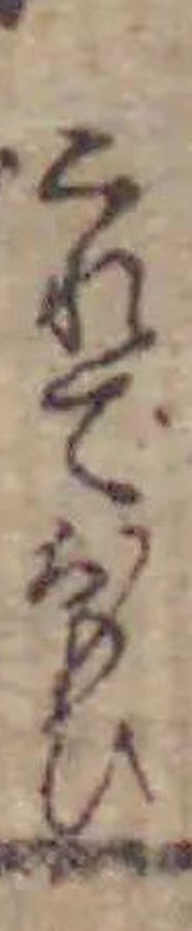これでおもひ
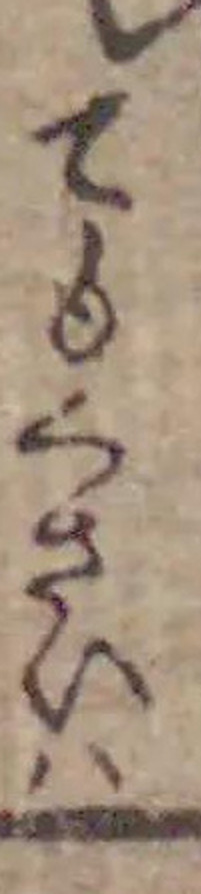てもくさいは
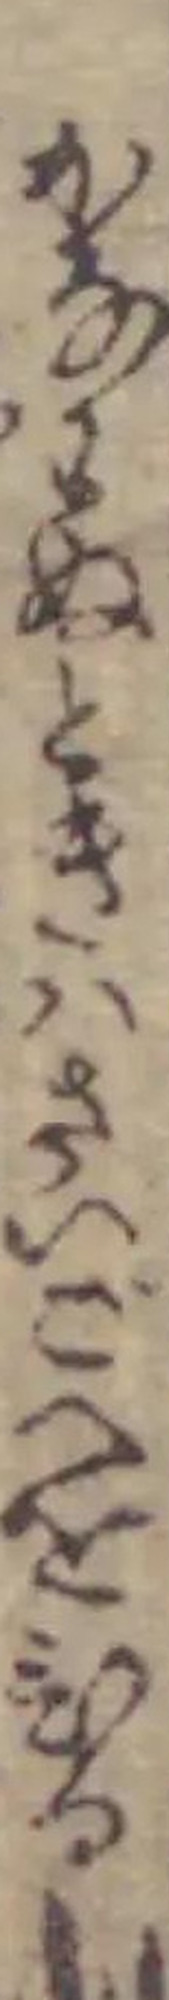かなわぬときはさいごへをひる
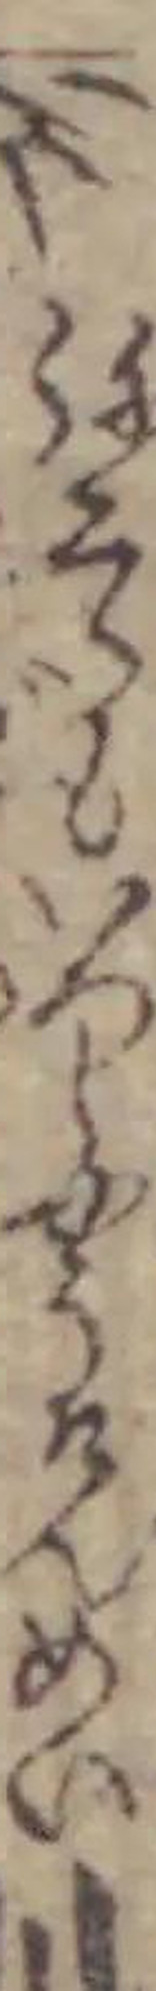弥二郎もいつしやうけんめい
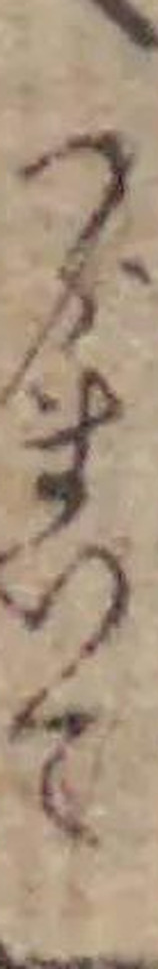つらまいて
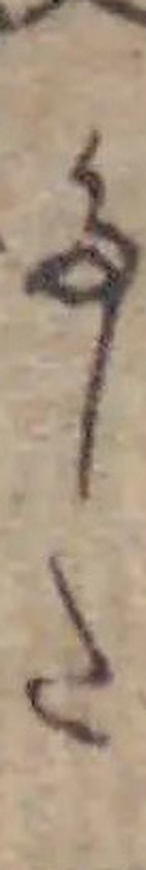だした
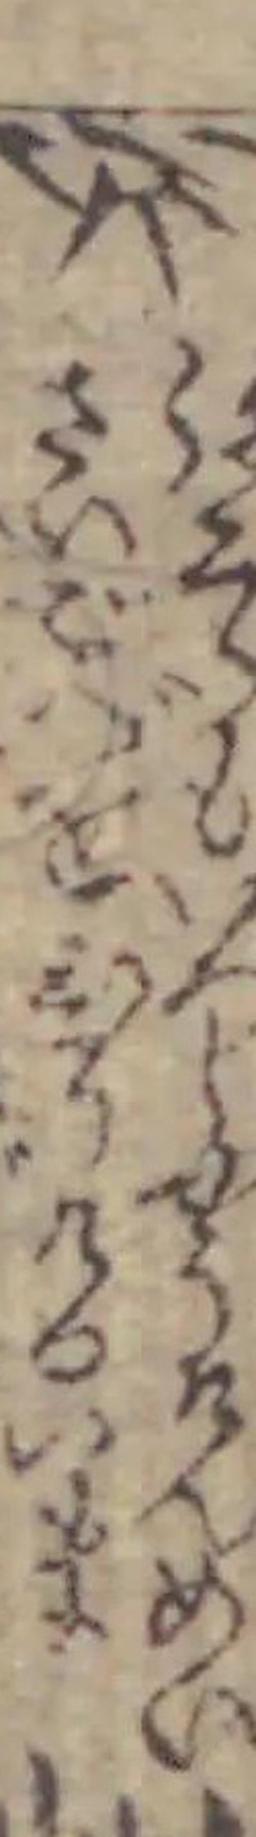さいごべをひりけるいま
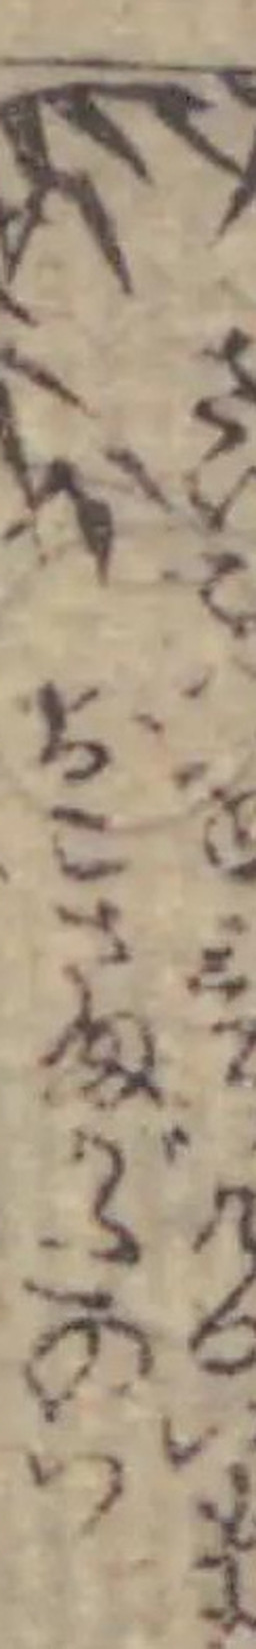おこさまがたのい
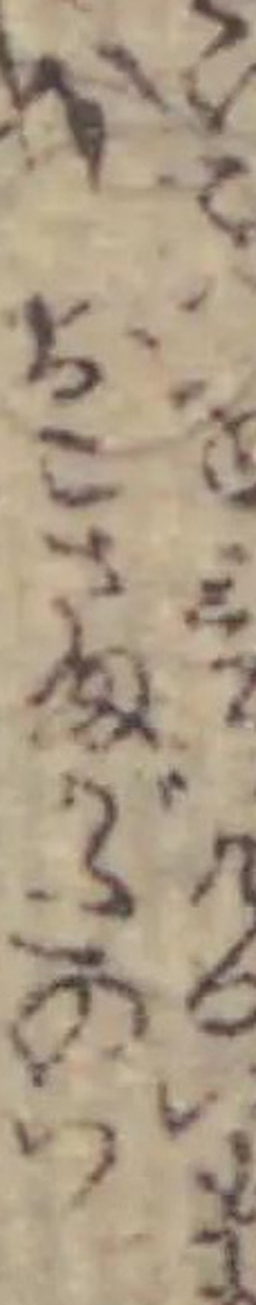おこさまがたのい
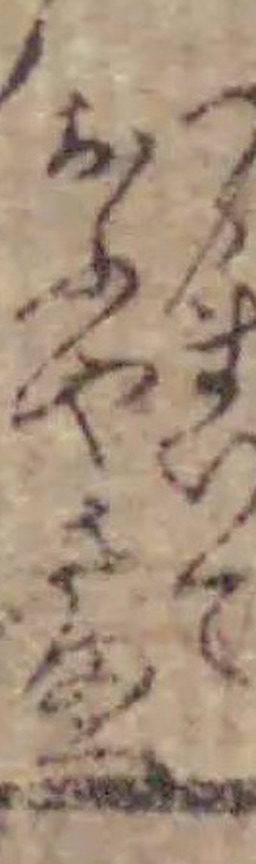おふやさまへ
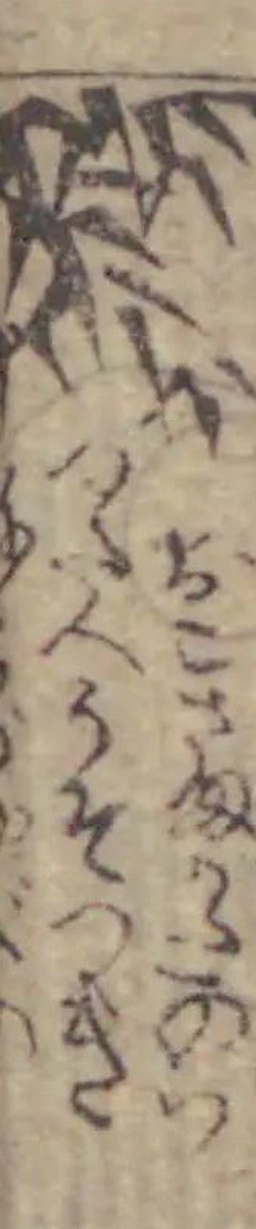つたへうそつき
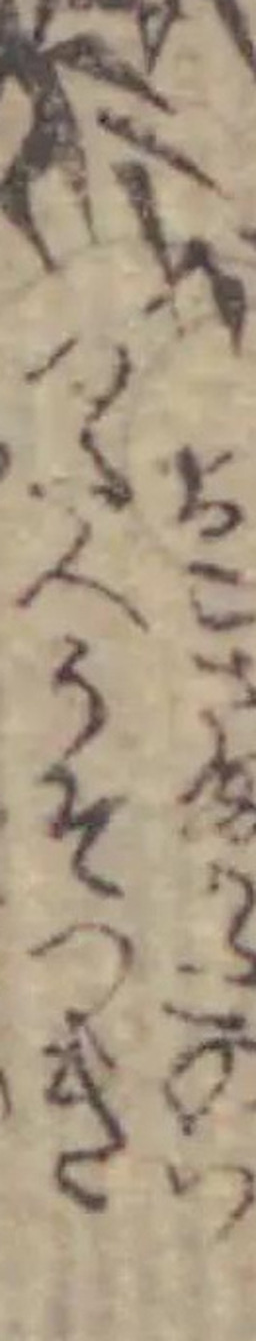つたへうそつき
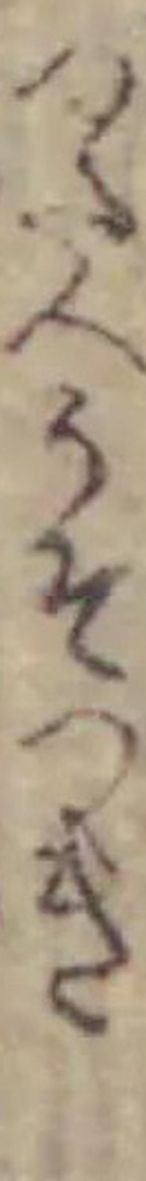つたへうそつき
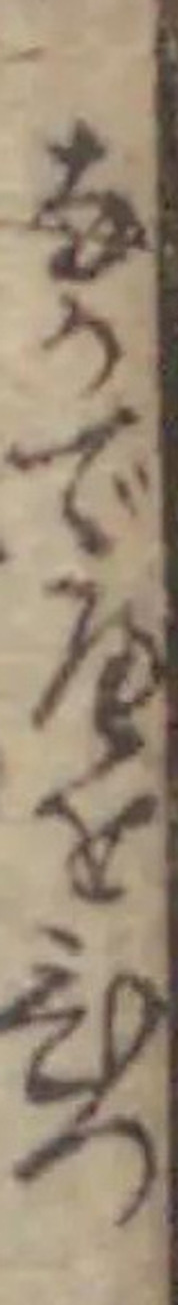なかでへをひつ
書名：虚言弥二郎傾城誠 3巻
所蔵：国立国会図書館 National Diet Library, JAPAN
